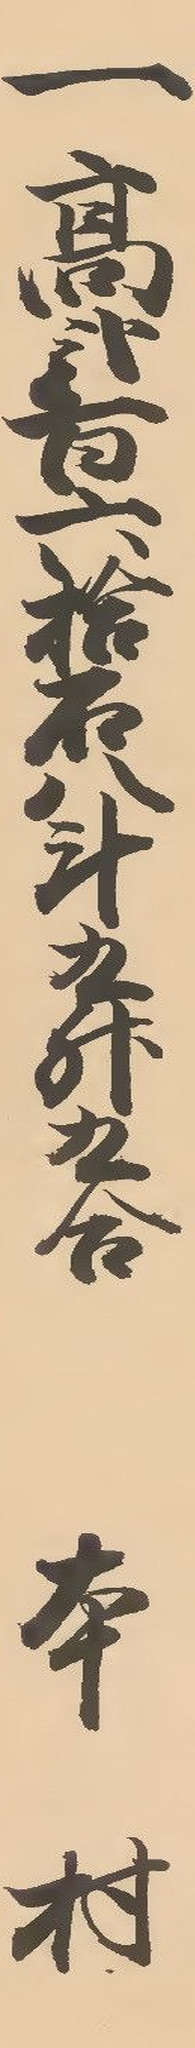一髙弐百六拾石八斗九升九合本村

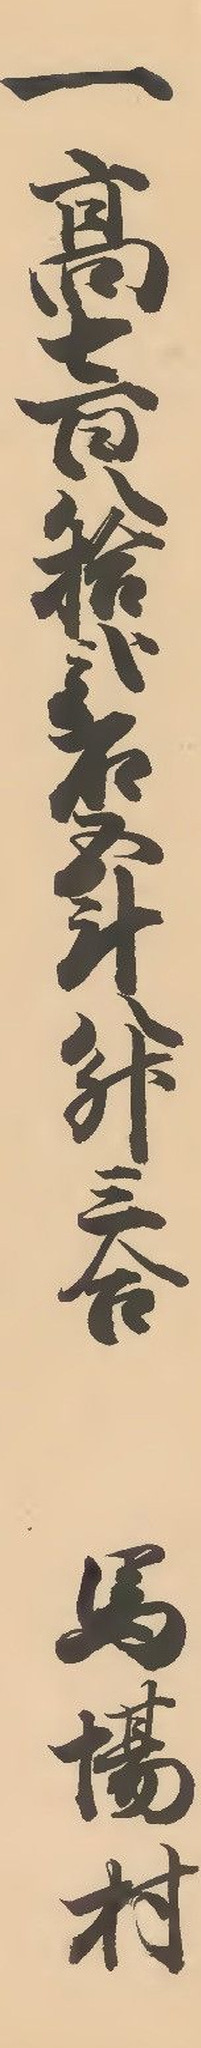一髙七百八拾弐石五斗八升三合馬場村
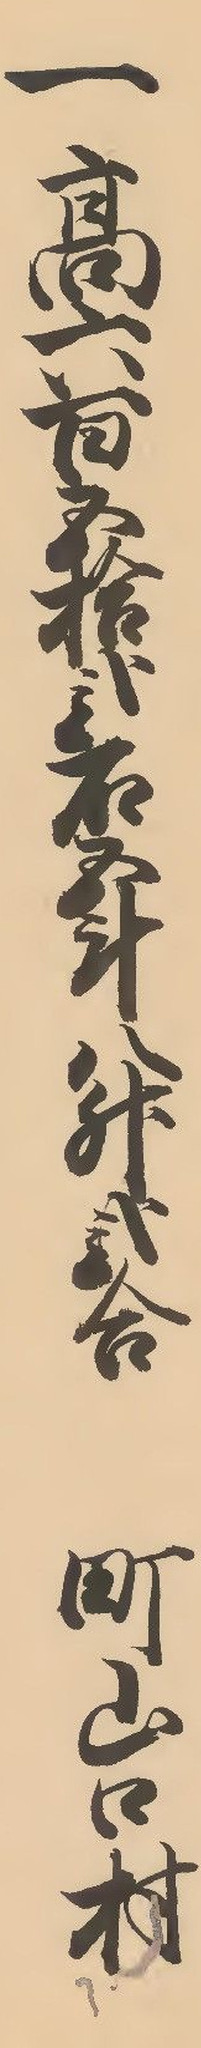一髙六百五拾弐石五斗八升弐合町山口村
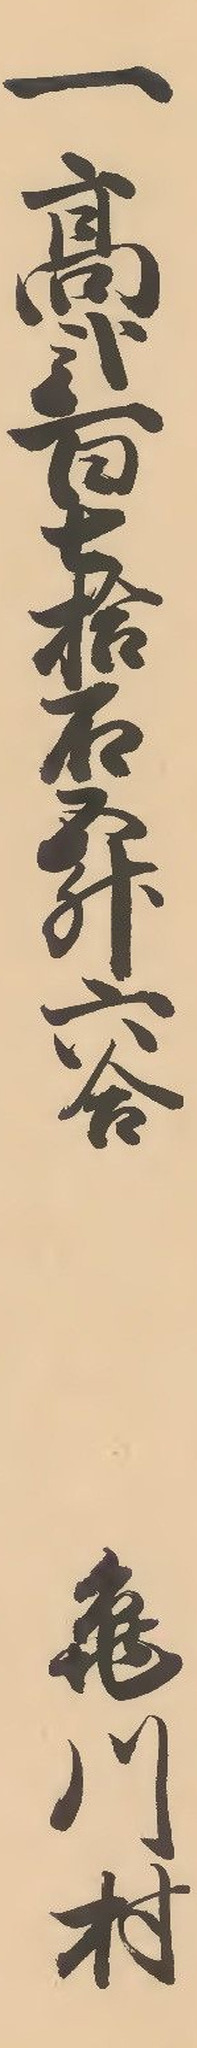一髙弐百七拾石五升六合龜川村
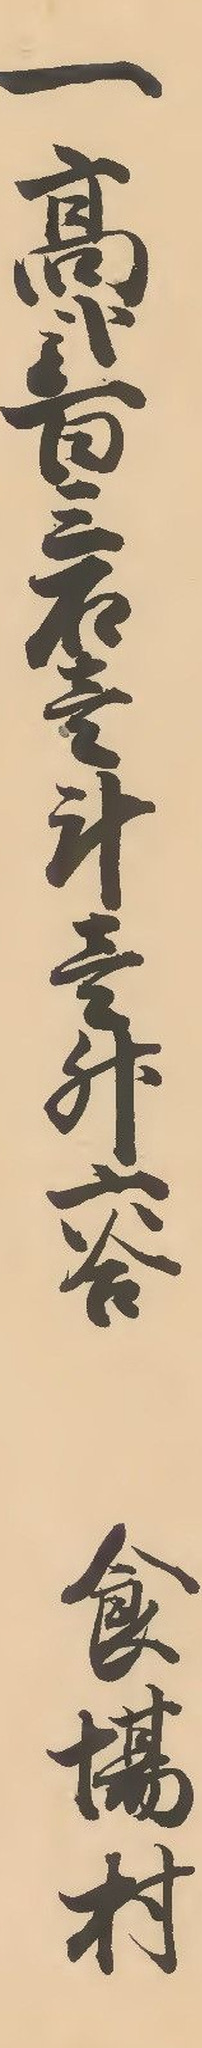一髙弐百三石壱斗壱升六合食場村
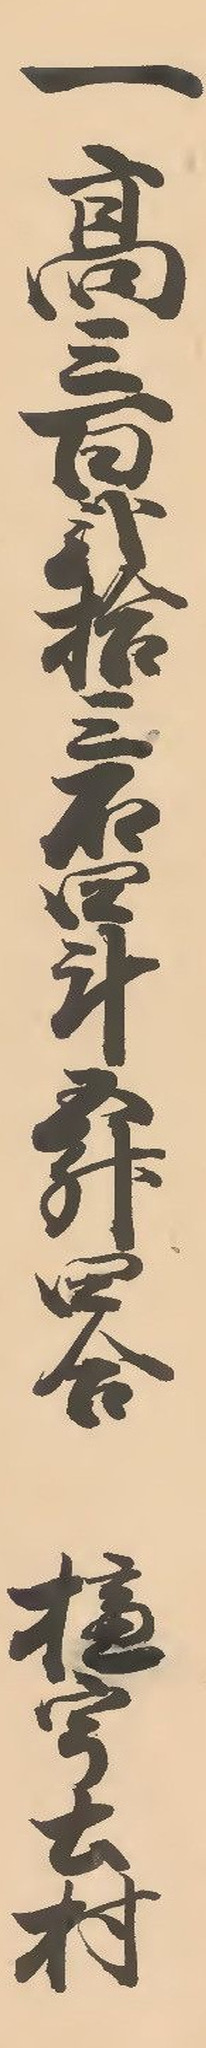一髙三百弐拾三石四斗五升四合宇土村
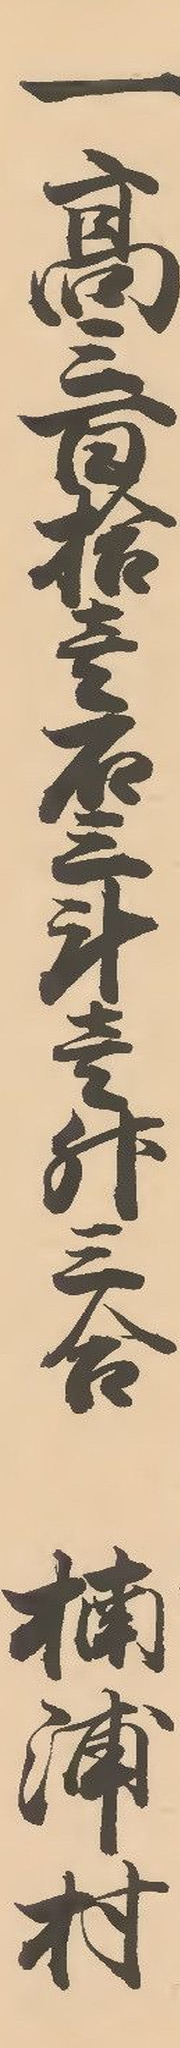一髙三百拾壱石三斗壱升三合楠浦村
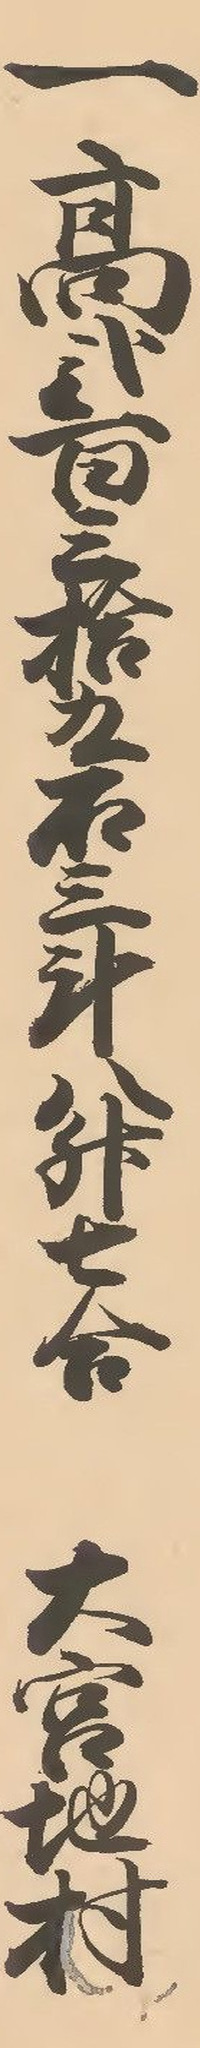一髙弐百三拾九石三斗八升七合大宮地村
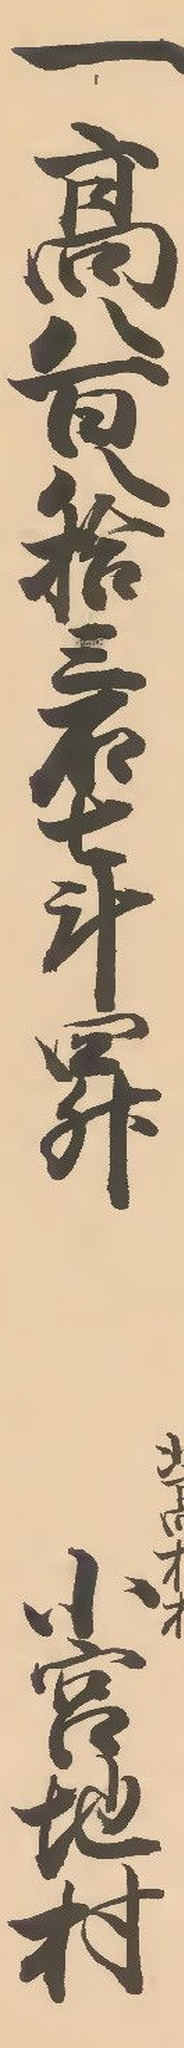一髙八百八拾三石七斗四升小宮地村

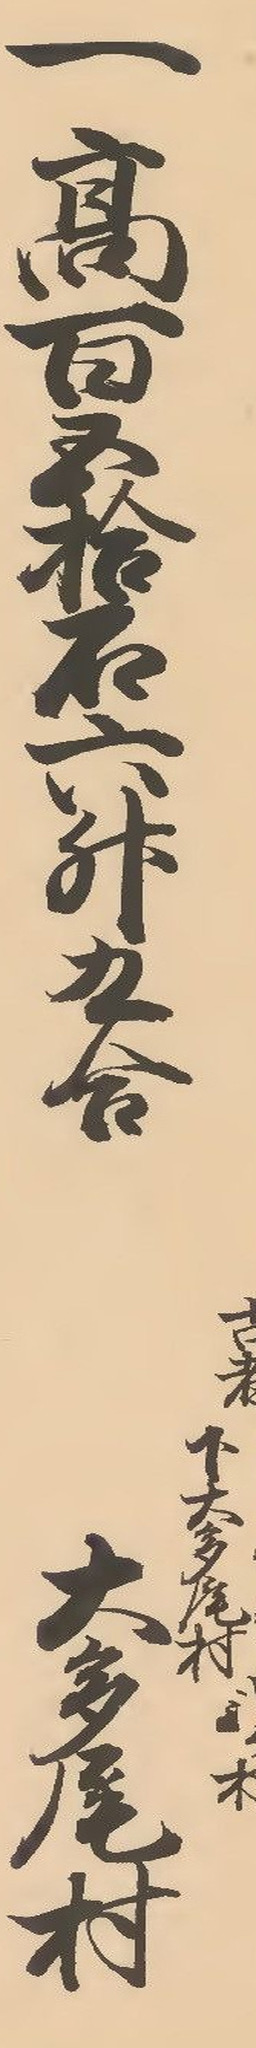一髙百五拾石六升九合大多尾村
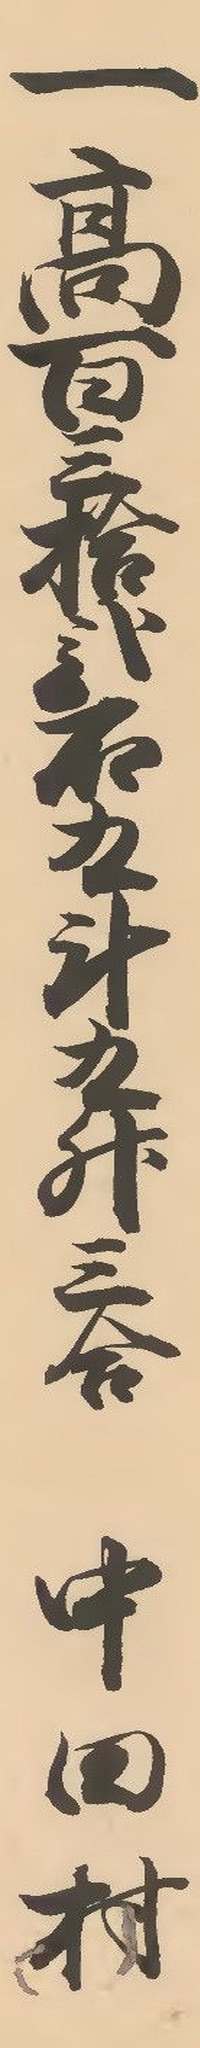一髙百三拾弐石九斗九升三合中田村
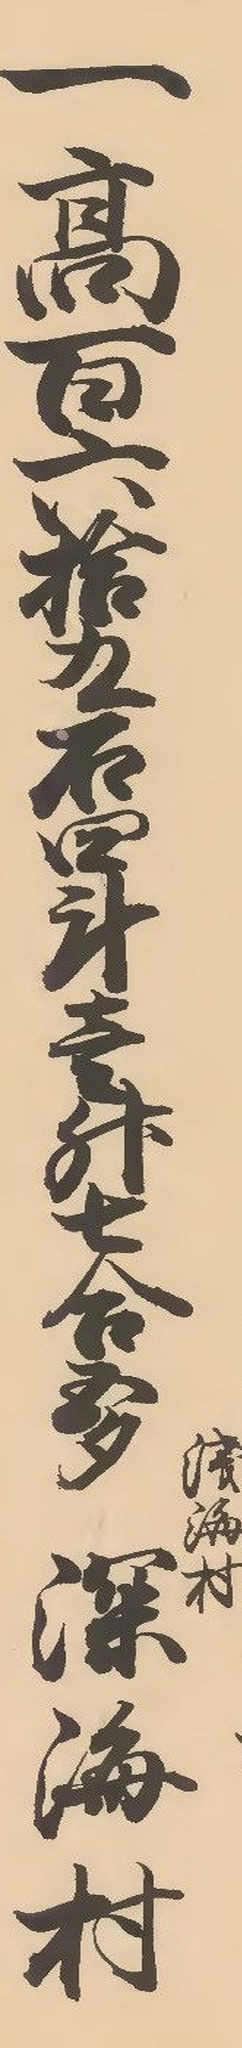一髙百六拾九石四斗壱升七合五夕深海村
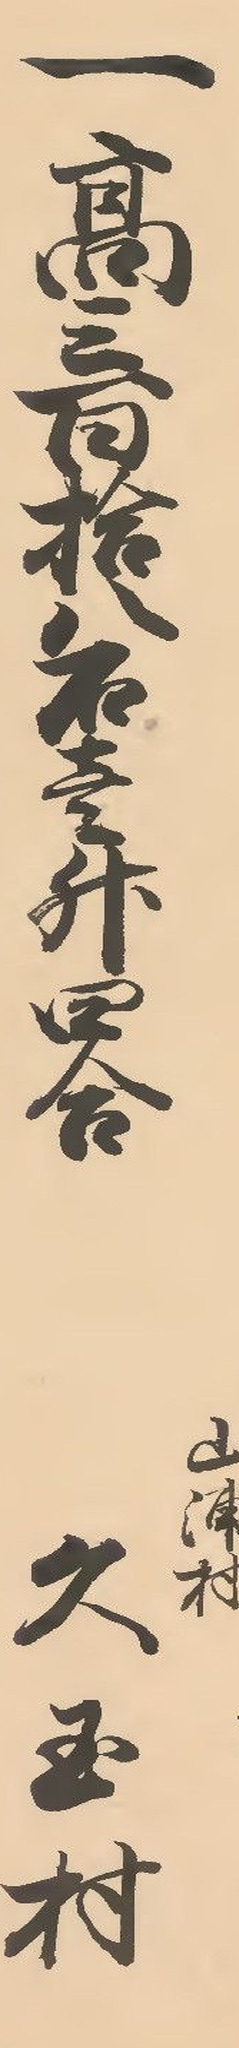一髙三百拾八石壱升四合久玉村
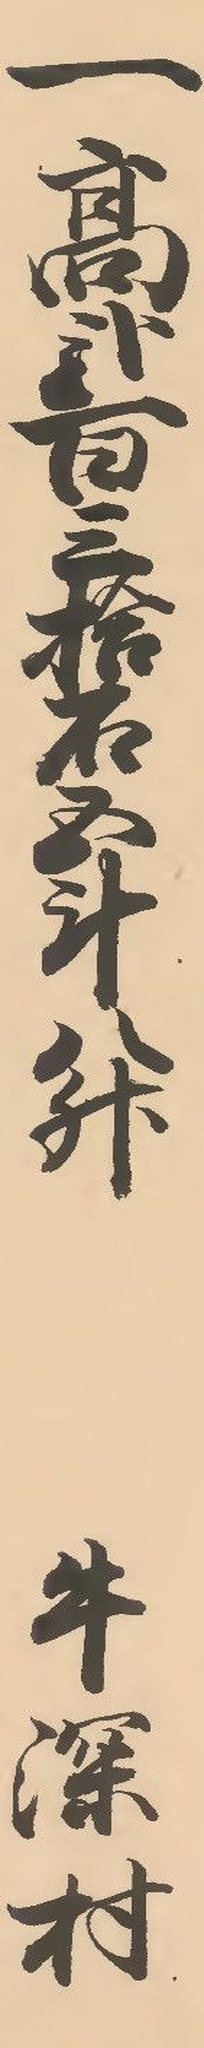一髙弐百三拾石五斗八升牛深村
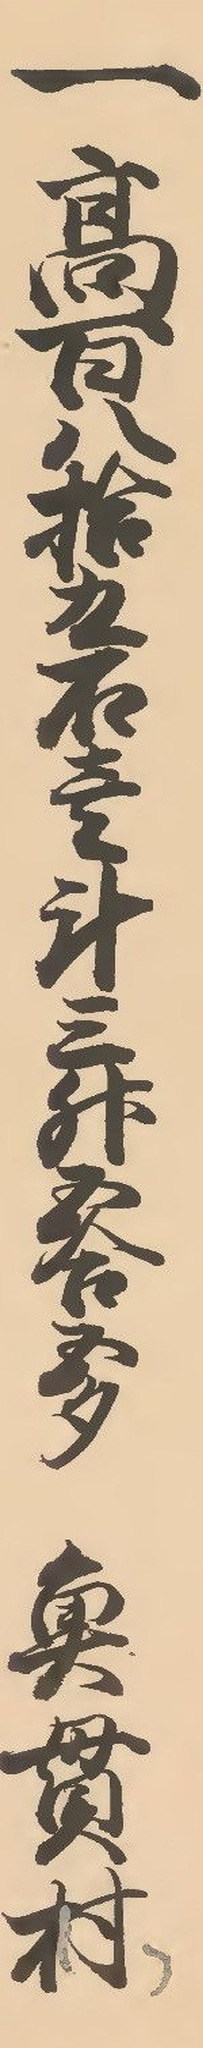一髙百八拾九石壱斗三升五合五夕魚貫村
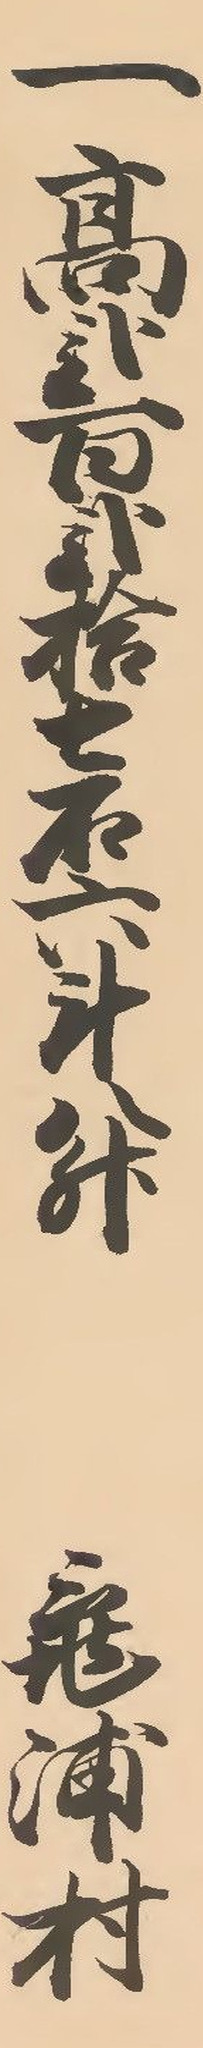一髙弐百弐拾七石六斗八升龜浦村
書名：肥後国郷帳
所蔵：国立公文書館 National Archives of Japan
